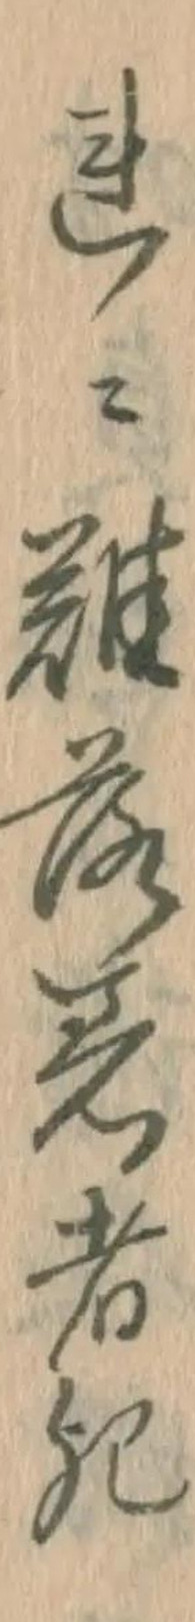連に難落着者歟
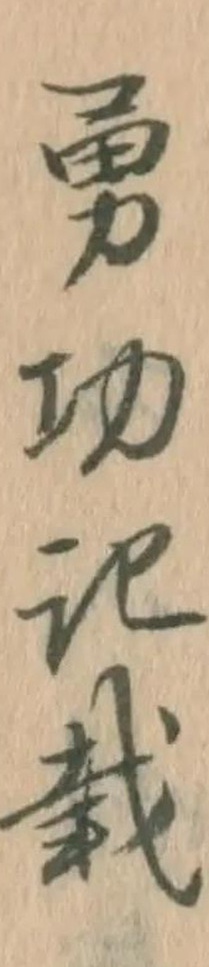勇功記載
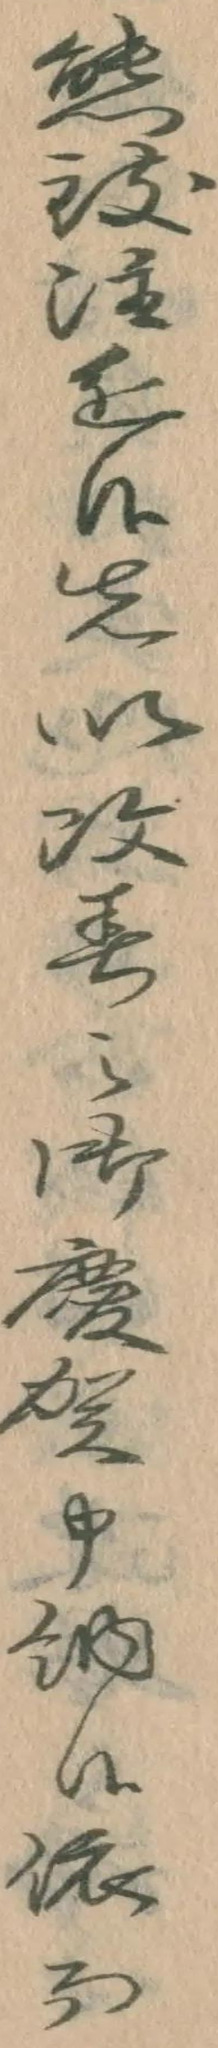熊致注進候先以改春之御慶賀申納候依而
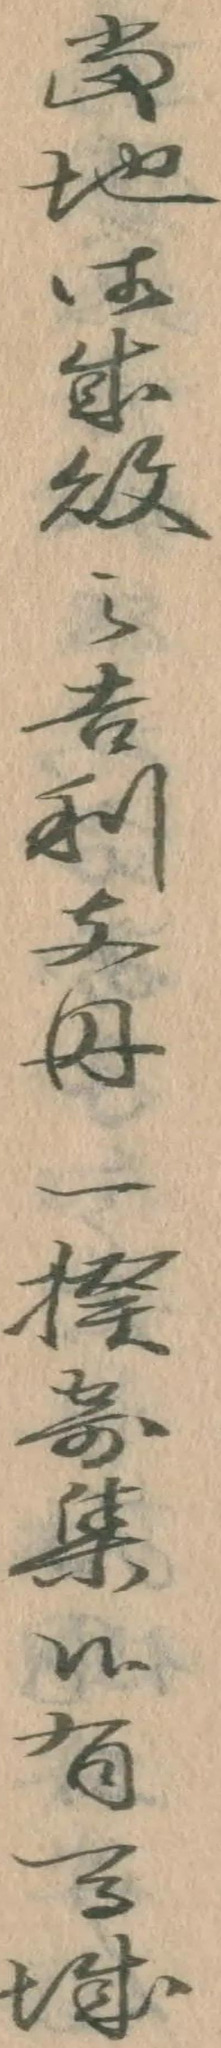当地御成敗之吉利支丹一揆寄集候有馬城
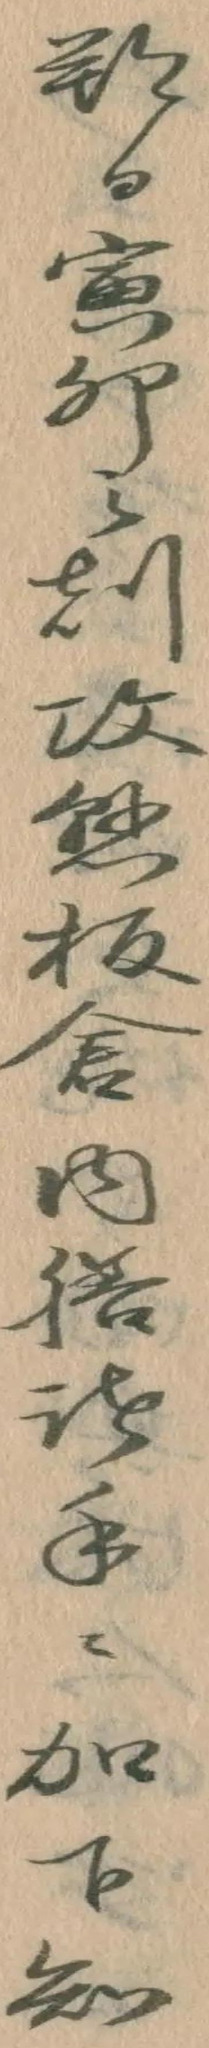朔日寅夘之刻攻懸板倉内膳諸手に加下知
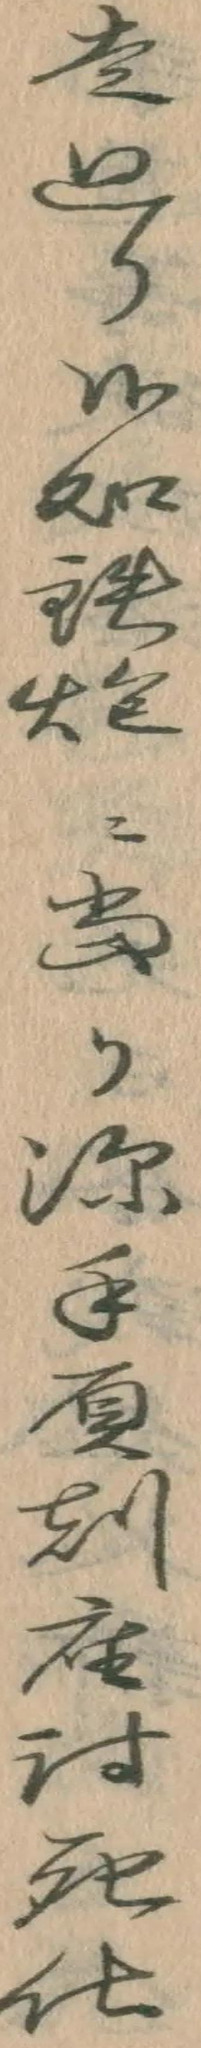走廻り候処鉄炮に当り深手負刻座討死仕
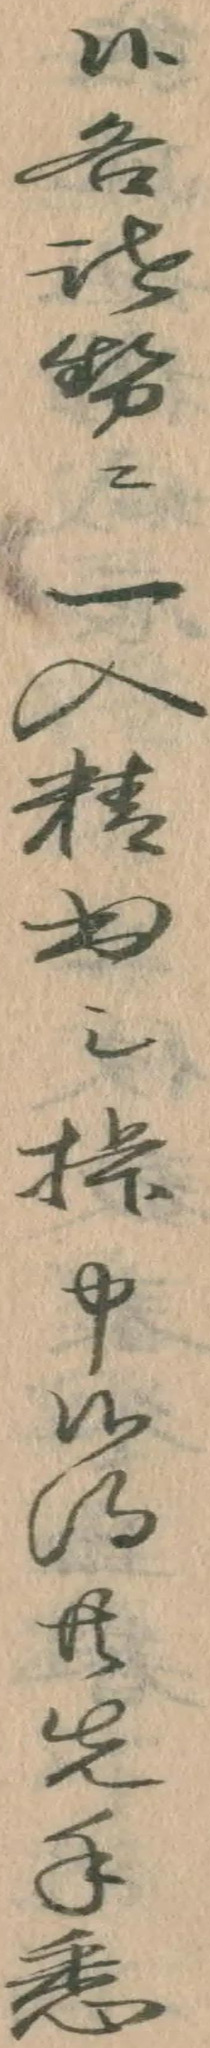候各諸勢に一入精出し挊申候得共先手悉
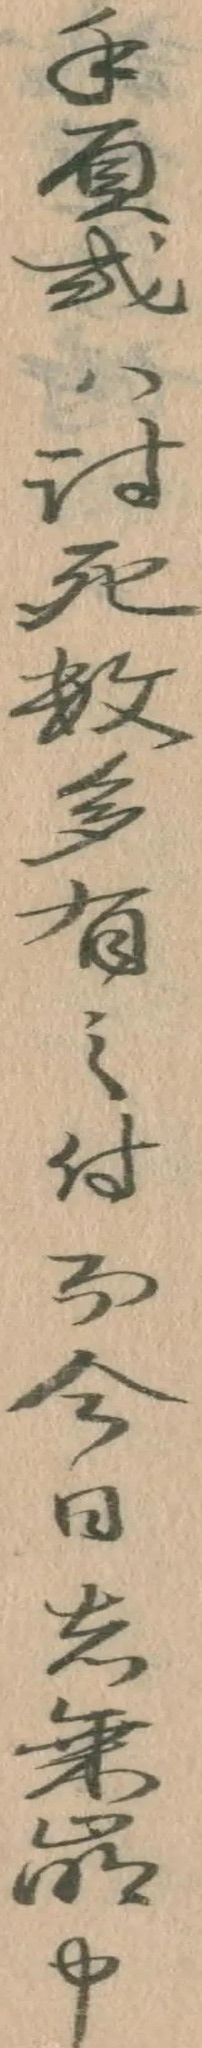手負或は討死数多有之付而今日者乗崩申
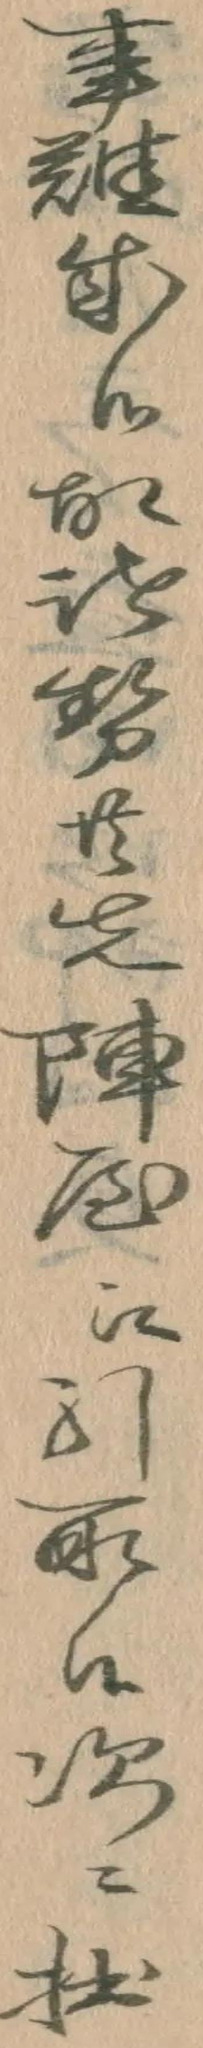事難成候故諸勢共先陣屋江引取候次に拙
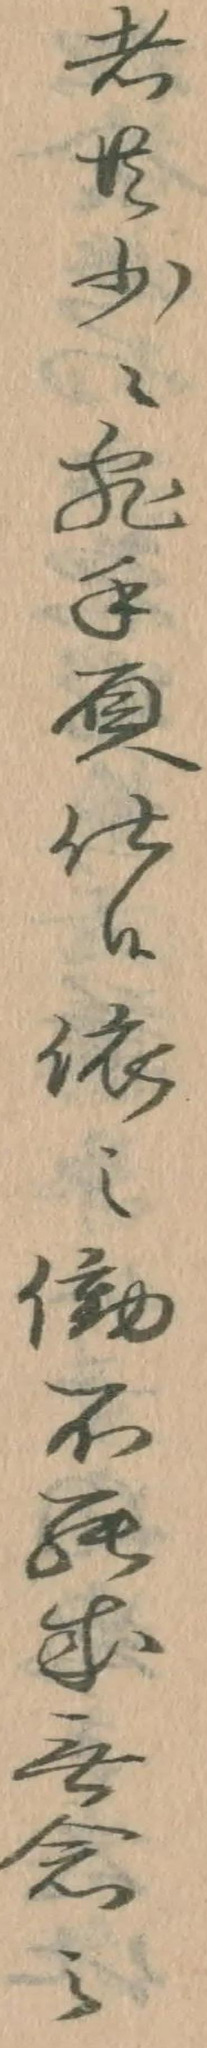者共少々究手負仕候依之働不罷成無念之
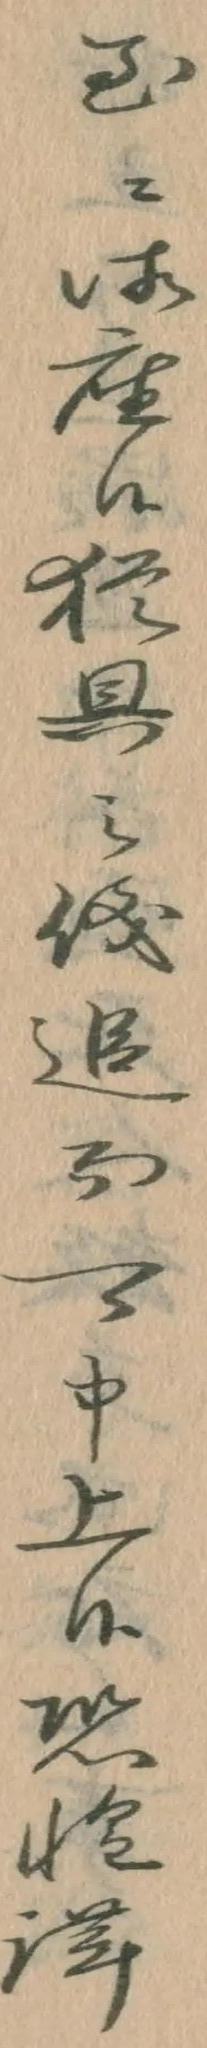至に御座候猶具之儀追而可申上候恐惶謹
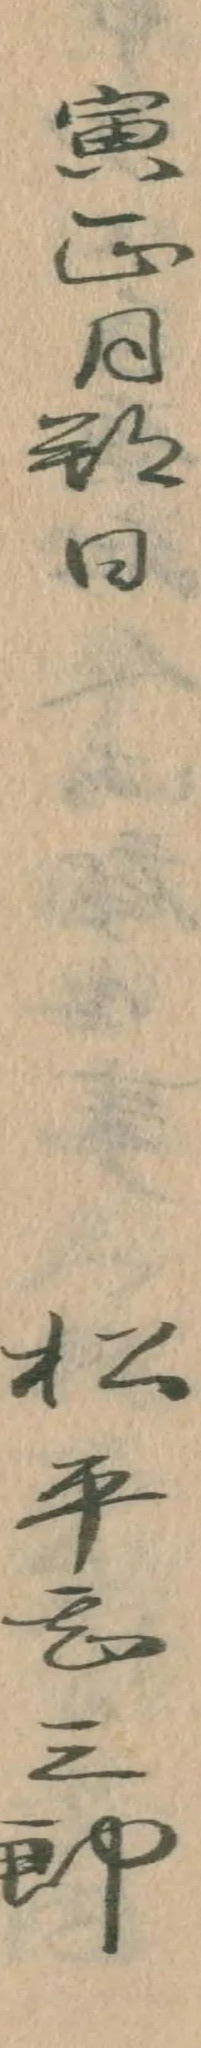寅正月朔日松平甚三郎
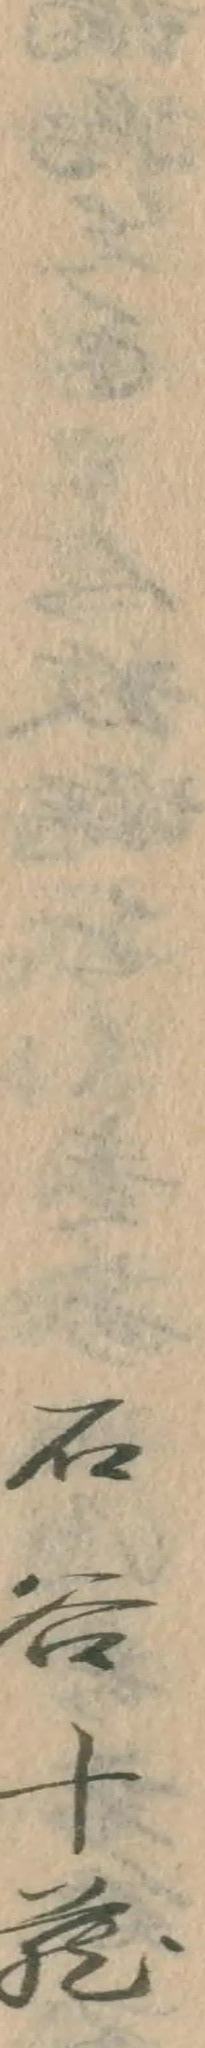石谷十蔵
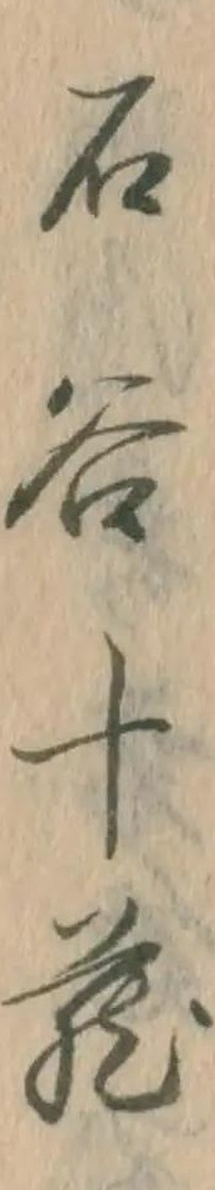石谷十蔵
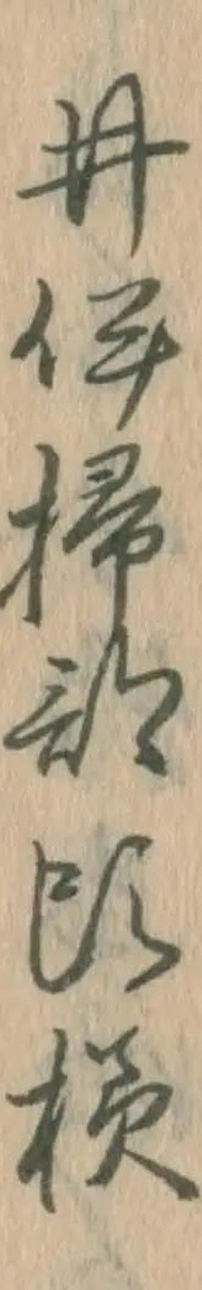井伊掃部頭様
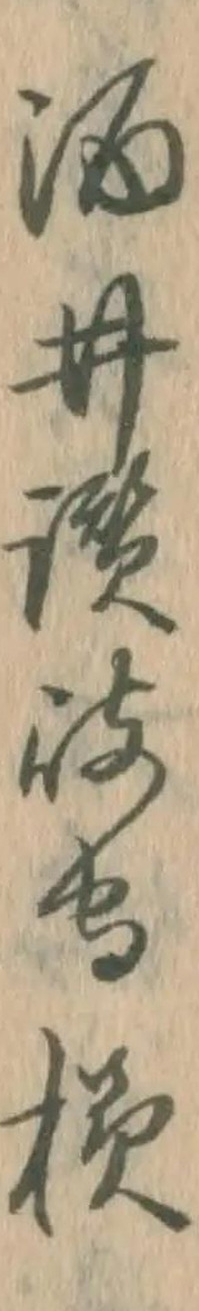酒井讃岐守様
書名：切支丹御退治記 49巻. [5]
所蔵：国立国会図書館 National Diet Library, JAPAN
